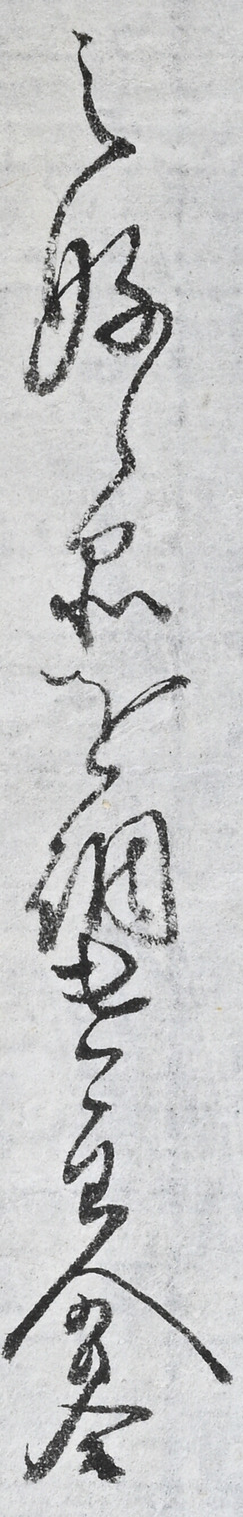之好候品を調遣主人有合
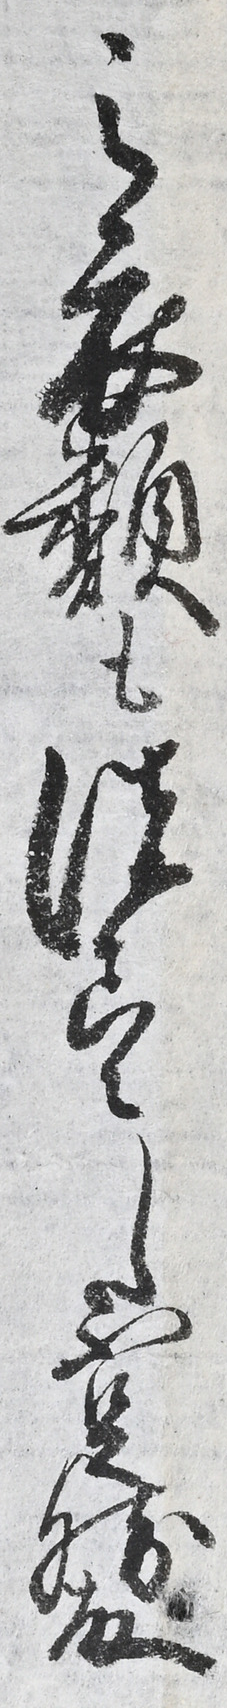之衣類も洗尽し不足勝故
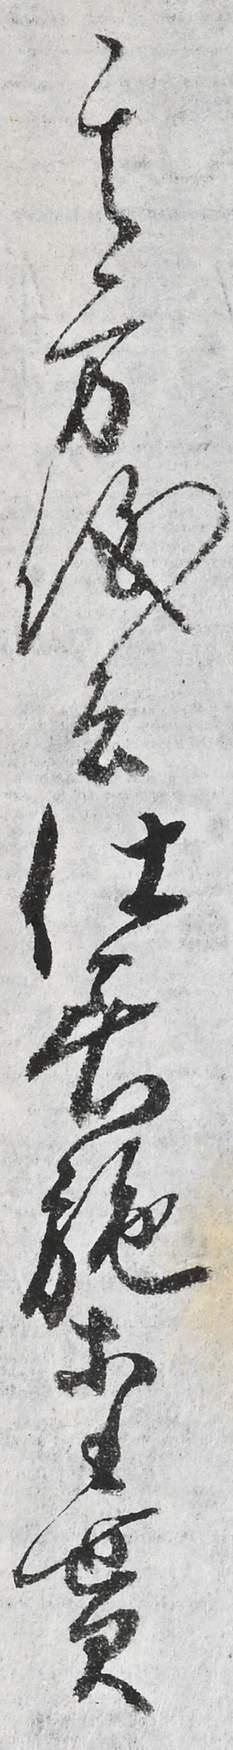其方儀は仕着施等も貰
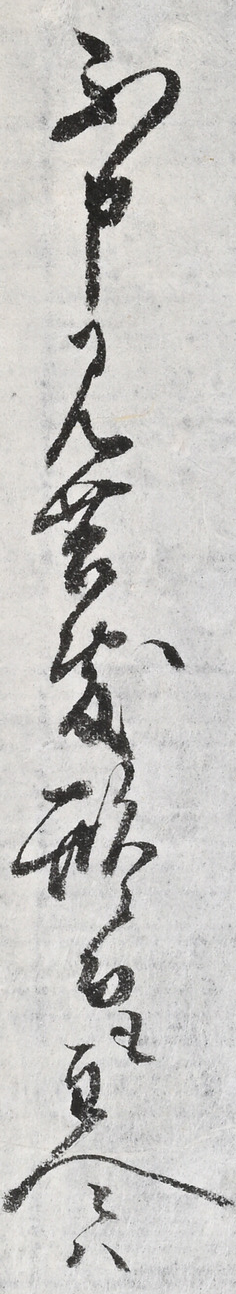不申見苦敷形ニ而も主人ニハ
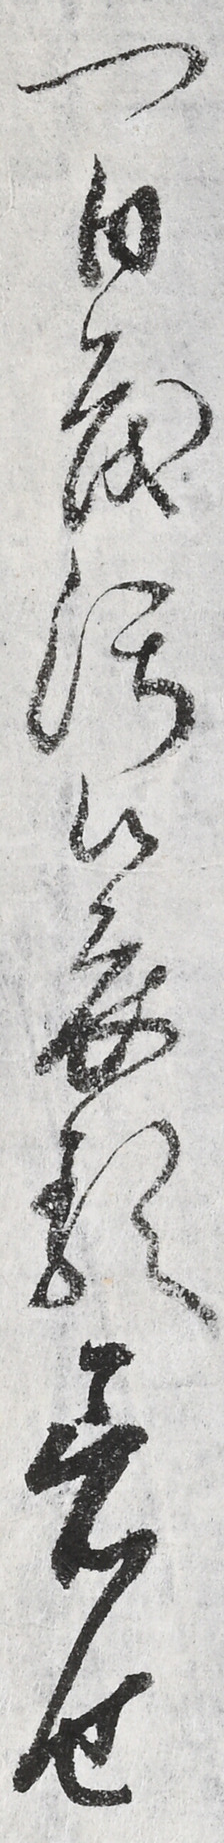一日も汚候衣類着せ
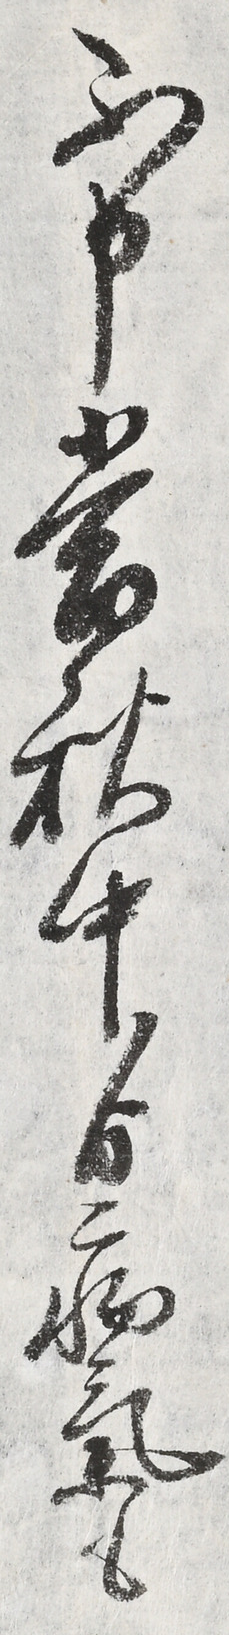不申当秋中より病気も
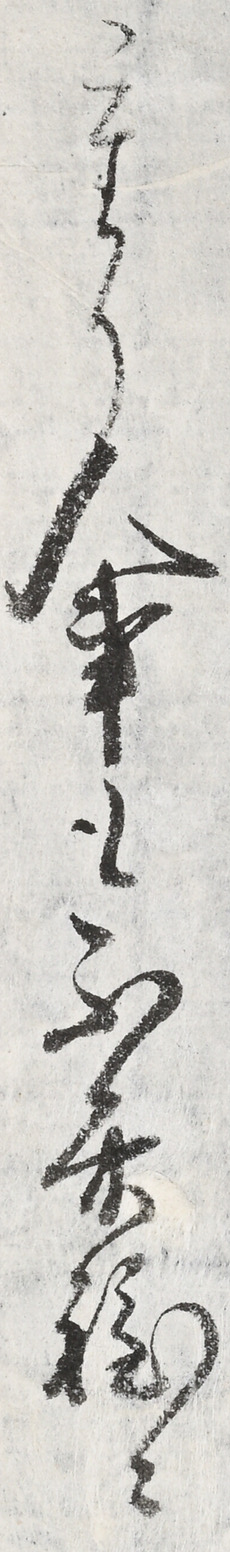重り人事も不弁程ニ
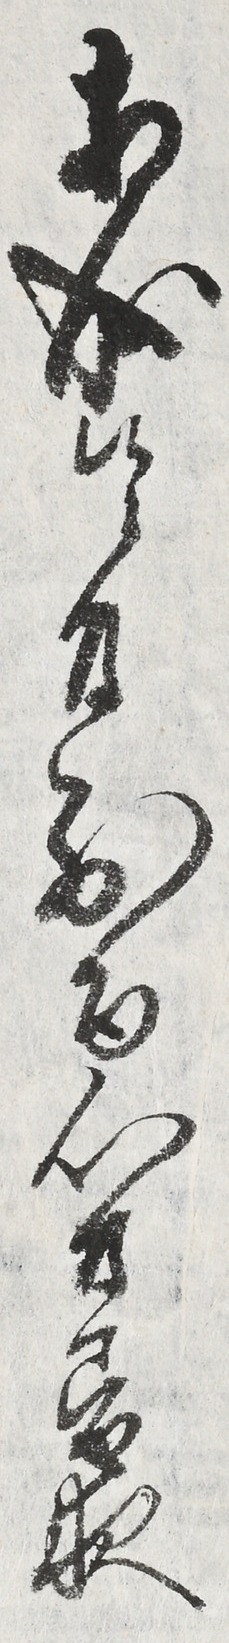相成候ニ付至て心付昼夜
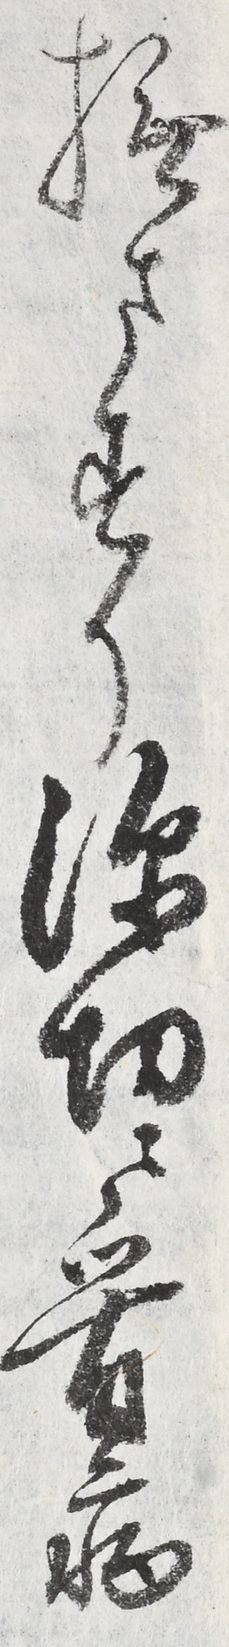撫さすり深切ニ看病

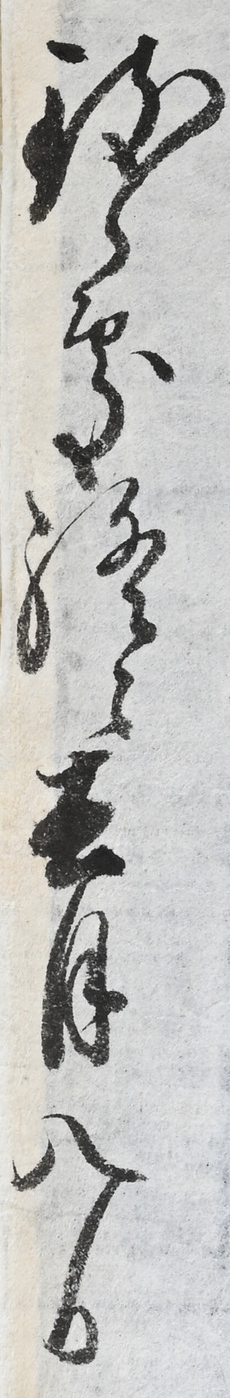致候処終ニ去月八日
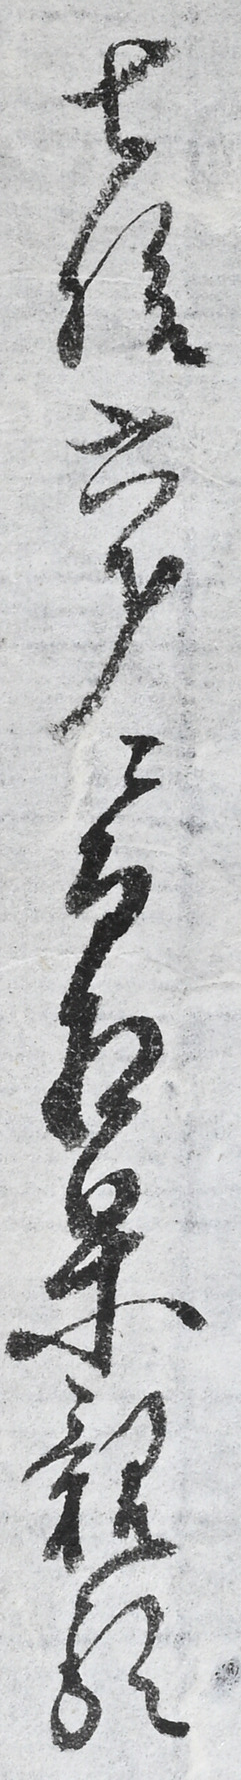七拾六才ニ而相果親類
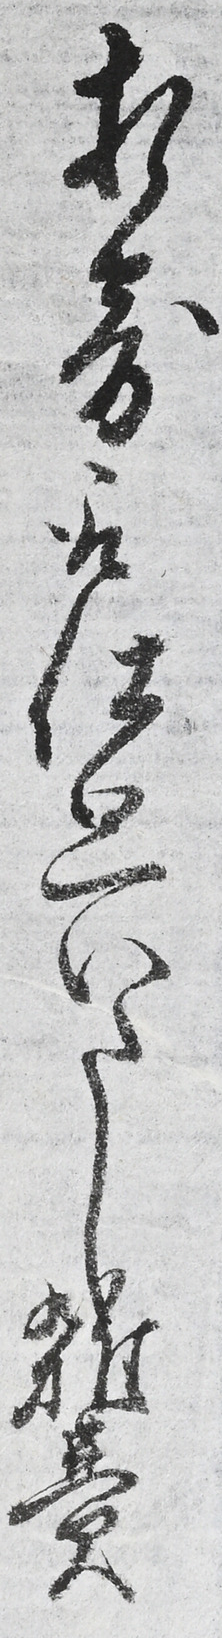相寄取仕廻いたし雑費
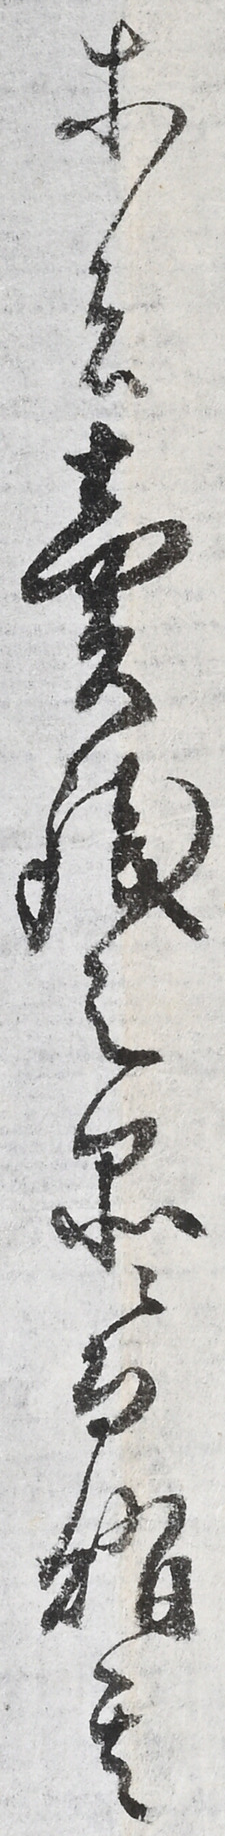等は売残之品ニ而賄其
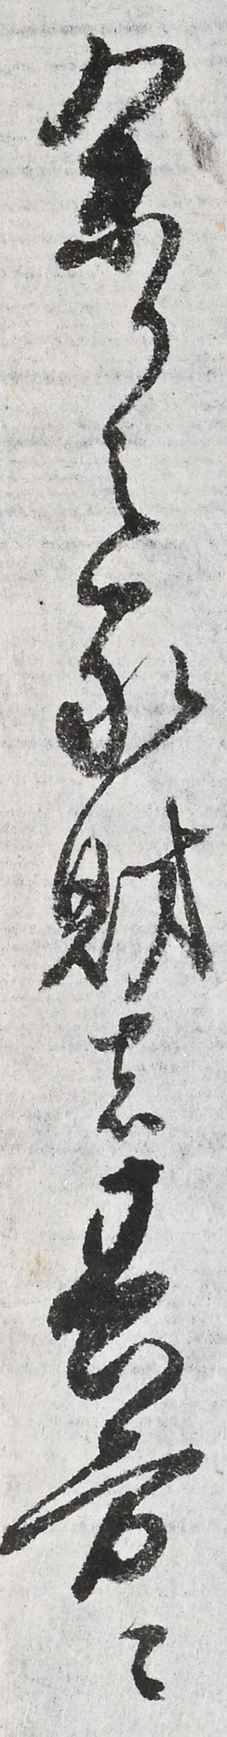余り之家財は其方ニ
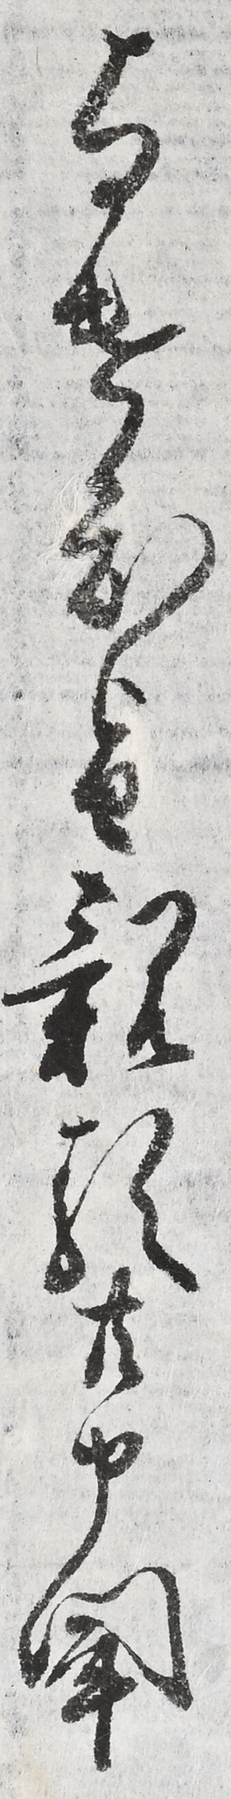与遣度旨親類共申聞
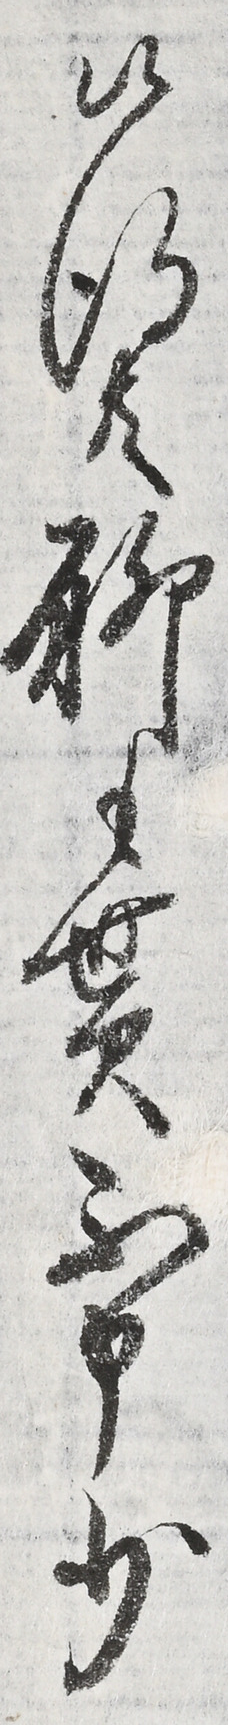候得共聊も貰不申少
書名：（書付）
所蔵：伊那市立高遠町図書館・合同会社AMANE
